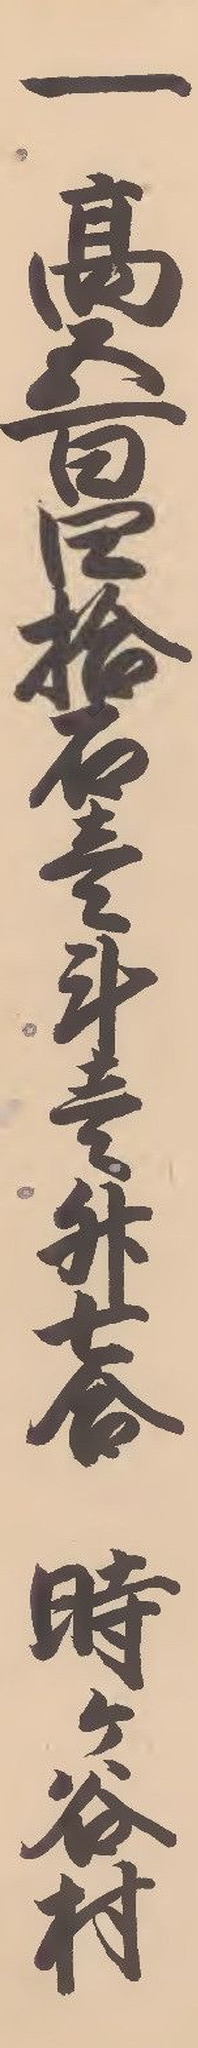一高五百四拾石壱斗壱升七合時ヶ谷村

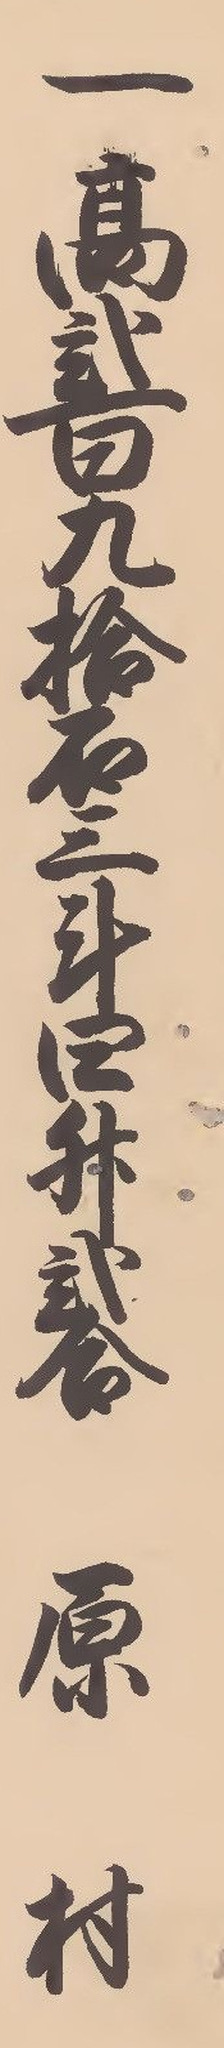一高弐百九拾石三斗四升弐合原村
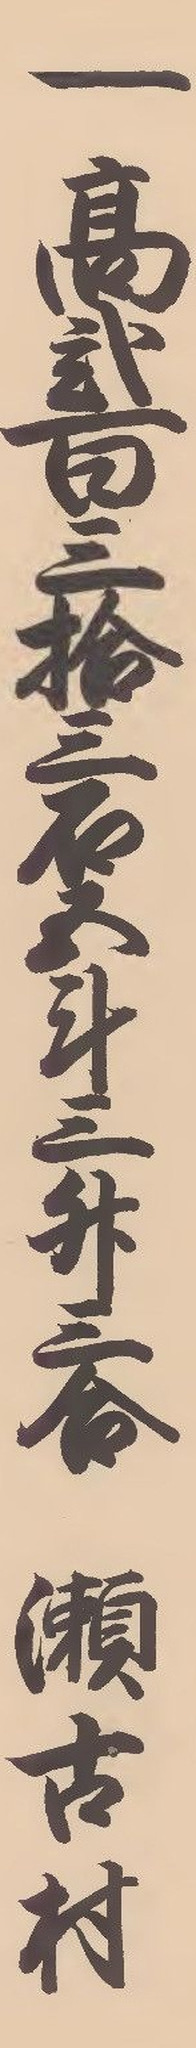一高弐百三拾三石五斗三升三合瀬古村
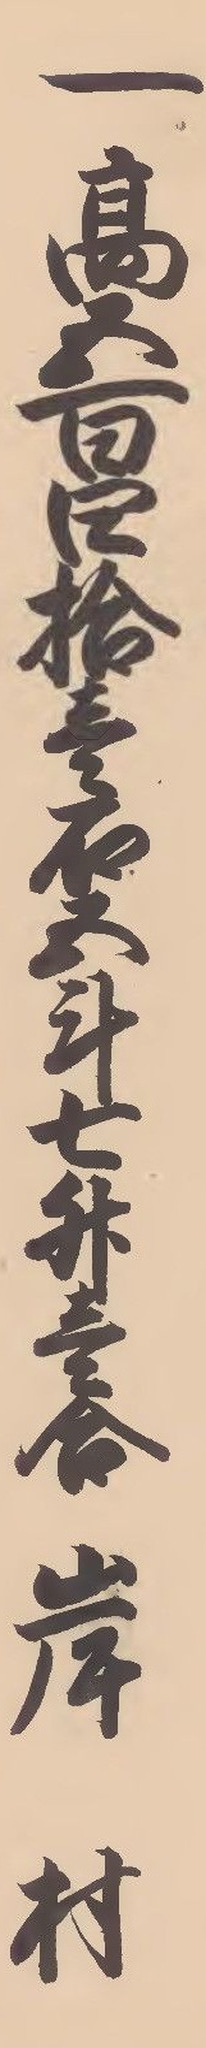一高五百四拾壱石五斗七升壱合岸村
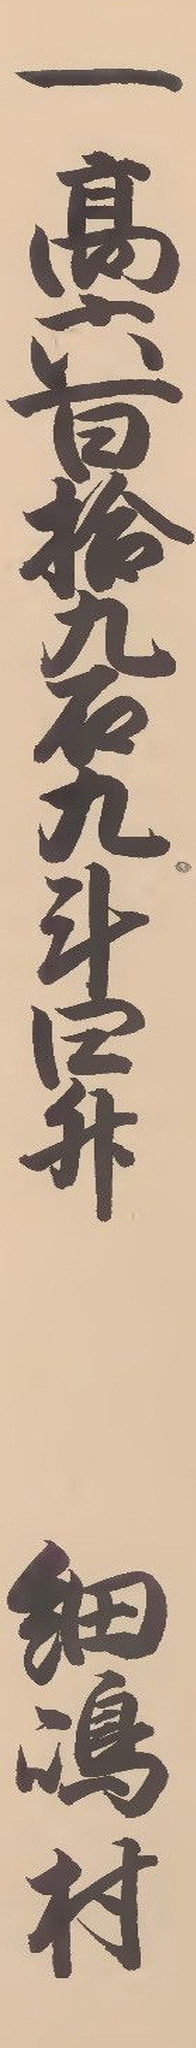一高六百拾九石九斗四升細島村
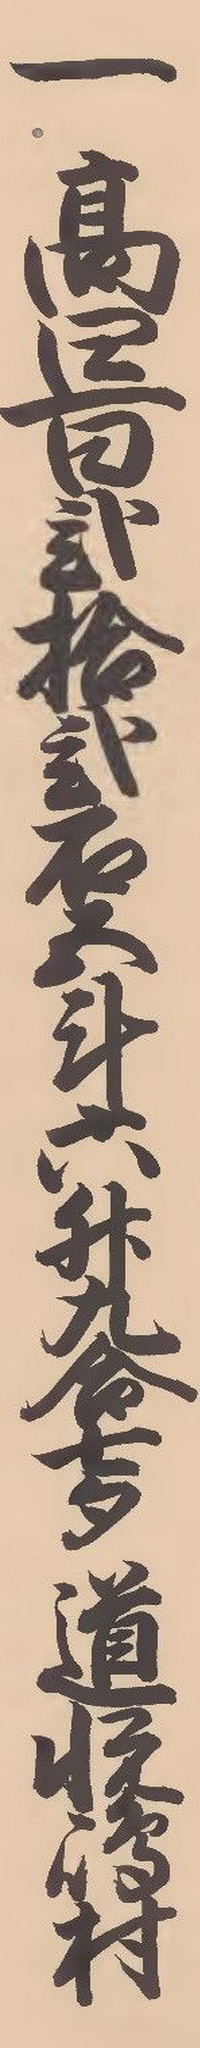一高四百弐拾弐石五斗六升九合七勺道悦島村
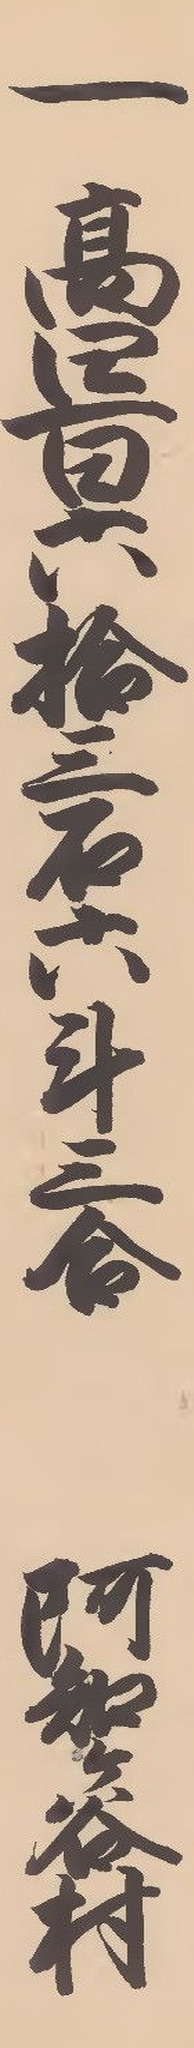一高四百六拾三石六斗三合阿知ヶ谷村

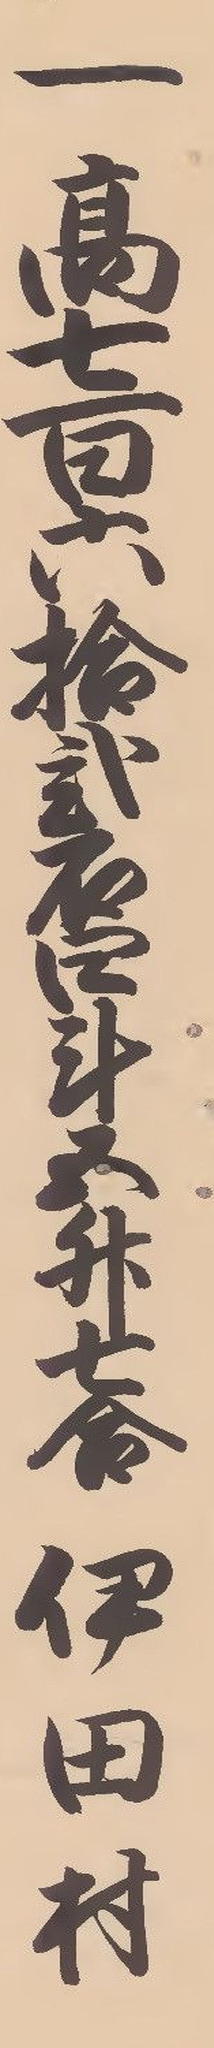一高七百六拾弐石四斗五升七合伊田村
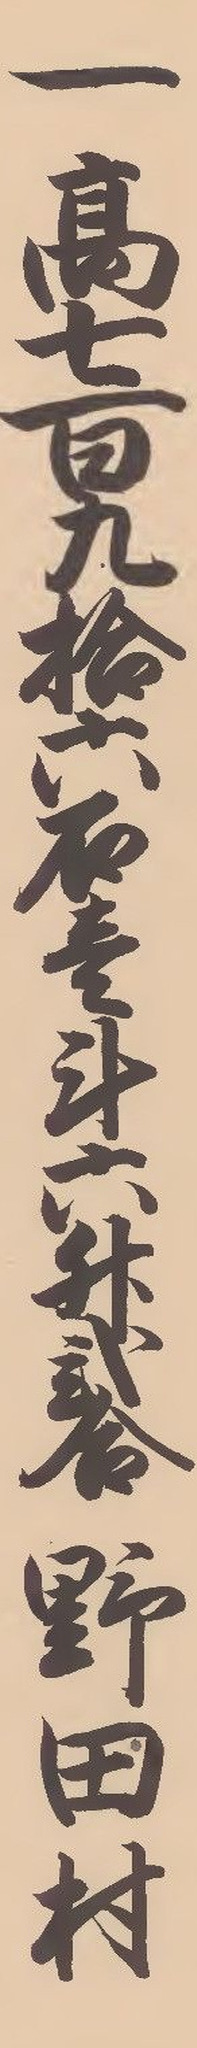一高七百九拾六石壱斗六升弐合野田村
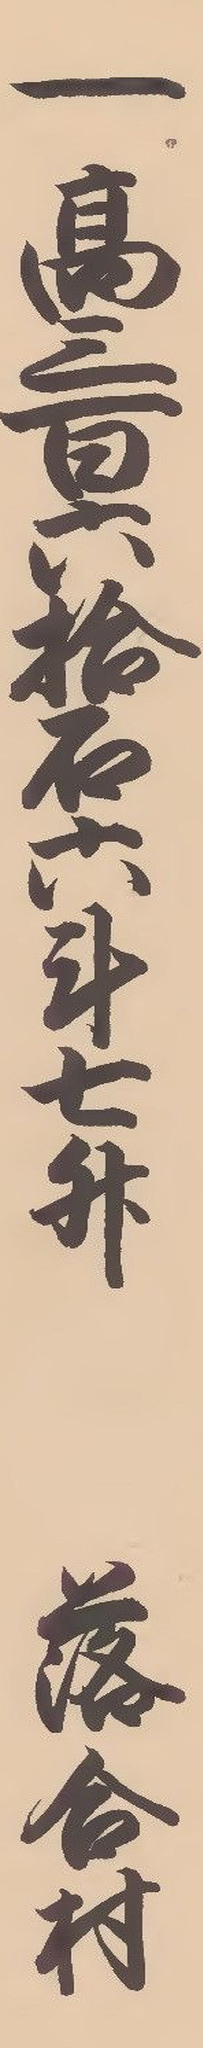一高三百六拾石六斗七升落合村
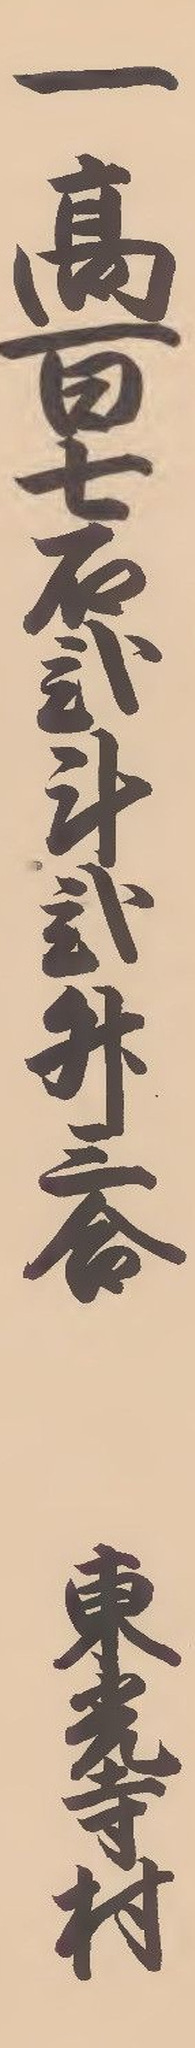一高百七石弐斗弐升三合東光寺村
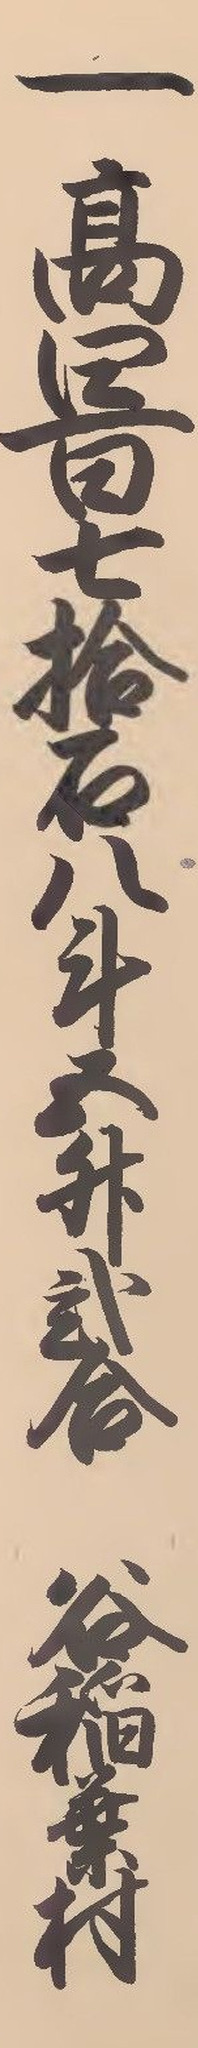一高四百七拾石八斗五升弐合谷稲葉村
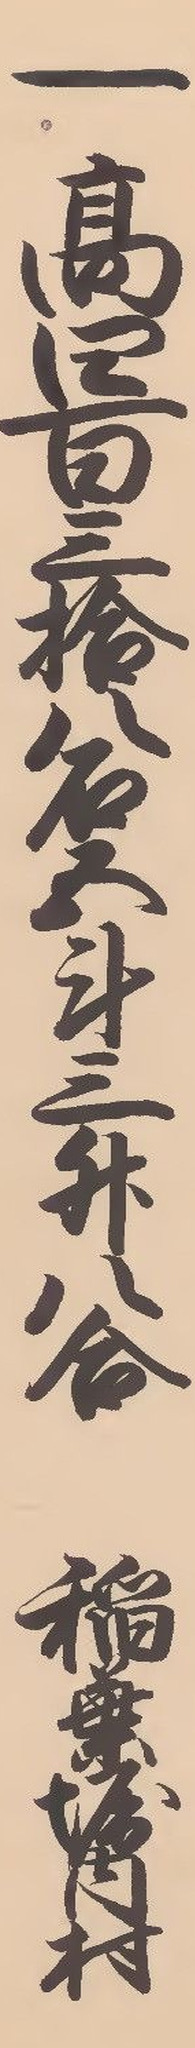一高四百三拾八石五斗三升八合稲葉堀内村
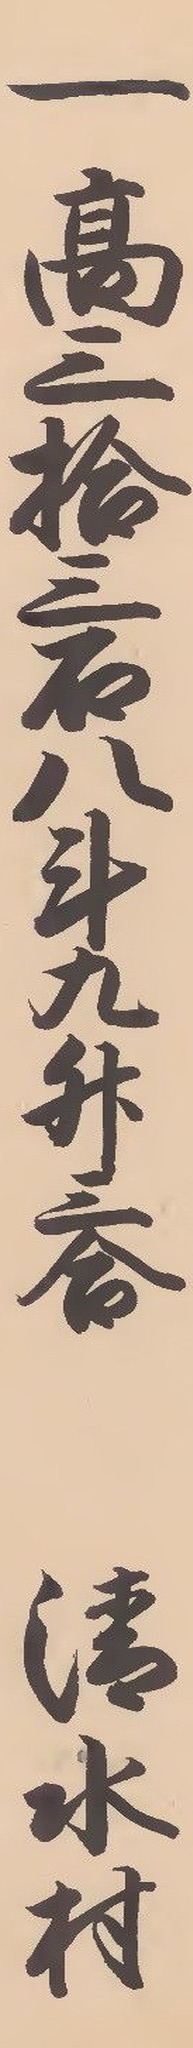一高三拾三石八斗九升三合清水村
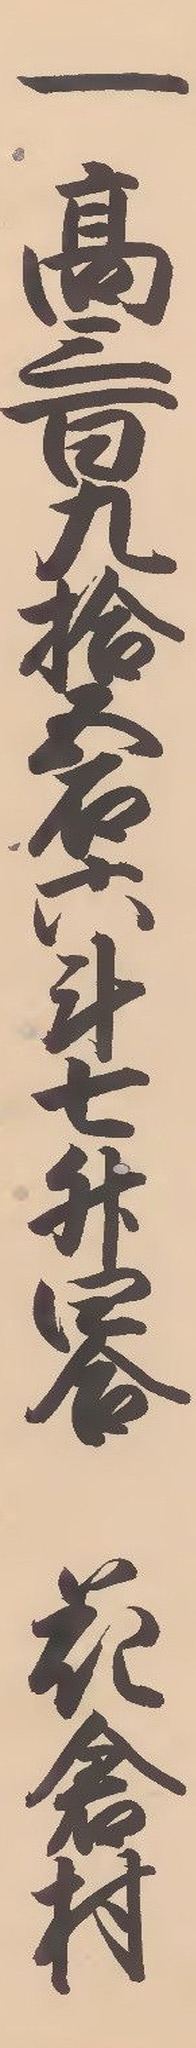一高三百九拾五石六斗七升四合花倉村

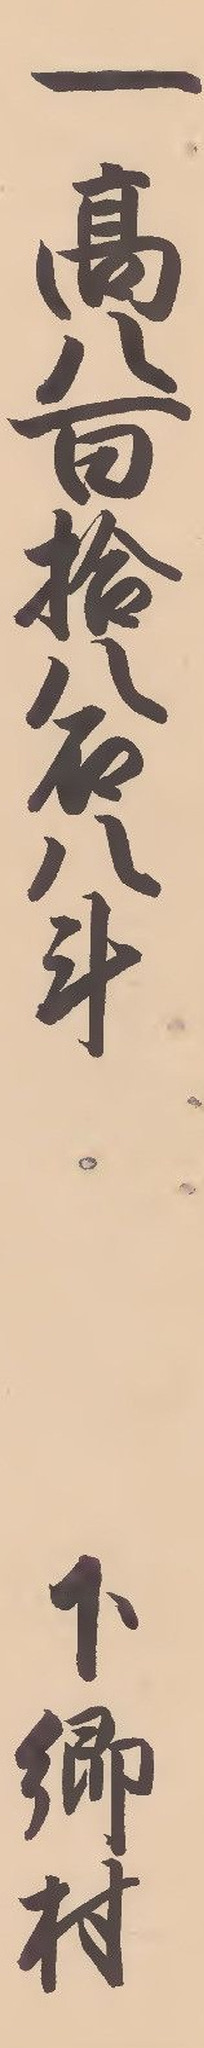一高八百拾八石八斗下郷村
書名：駿河国郷帳
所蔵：国立公文書館 National Archives of Japan
